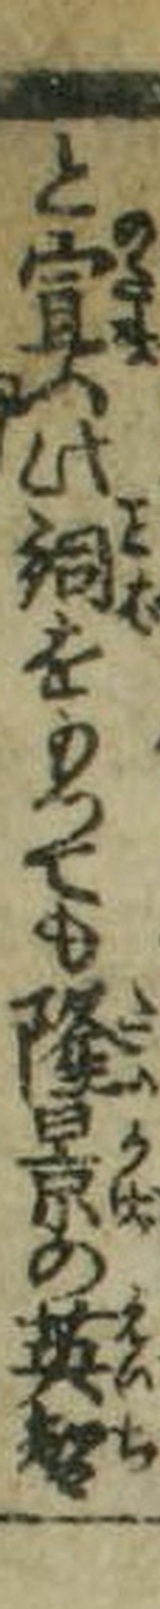と宣ふ此詞をもつても隆景の英智
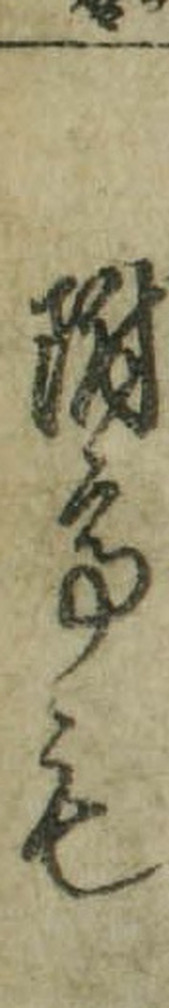附ても
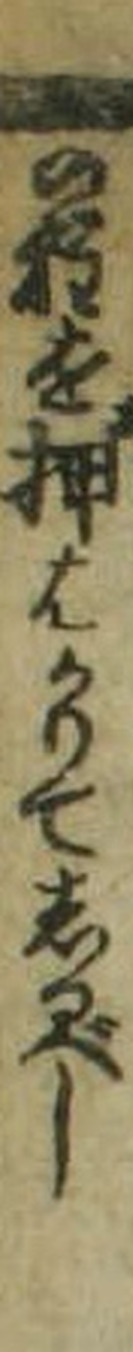の程を押はかりてしるべし

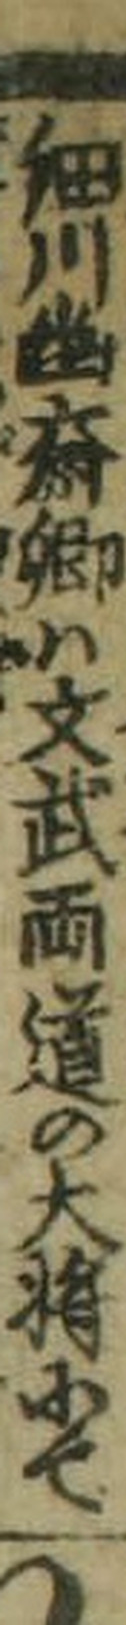細川幽斎卿は文武両道の大将にて
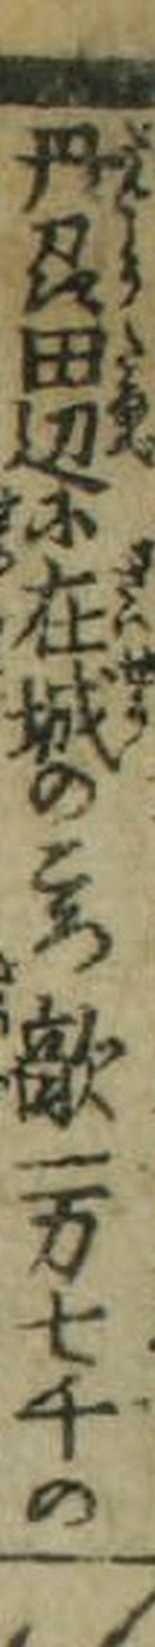丹州田辺に在城のころ歒一万七千の
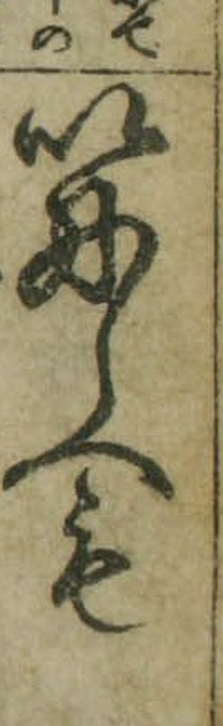いにしへも
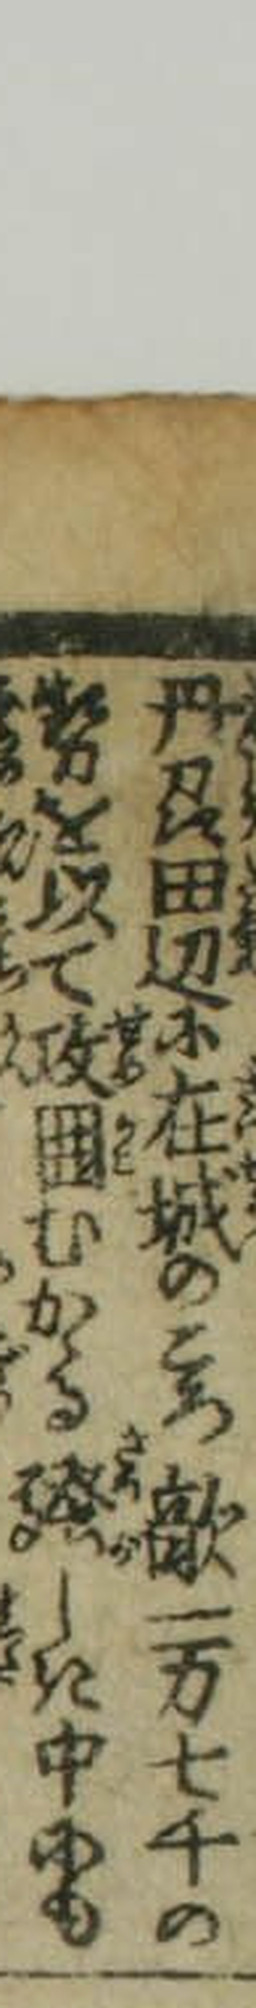勢を以て攻囲むかゝる騒しき中にも
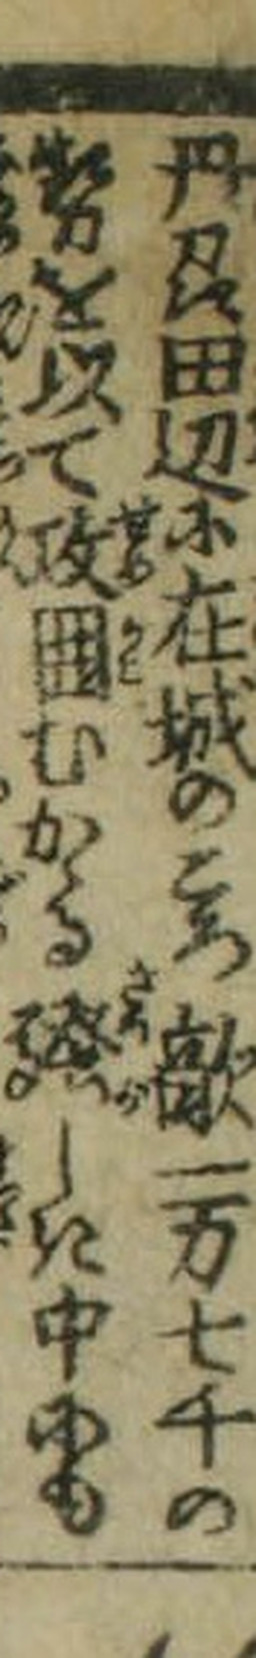勢を以て攻囲むかゝる騒しき中にも
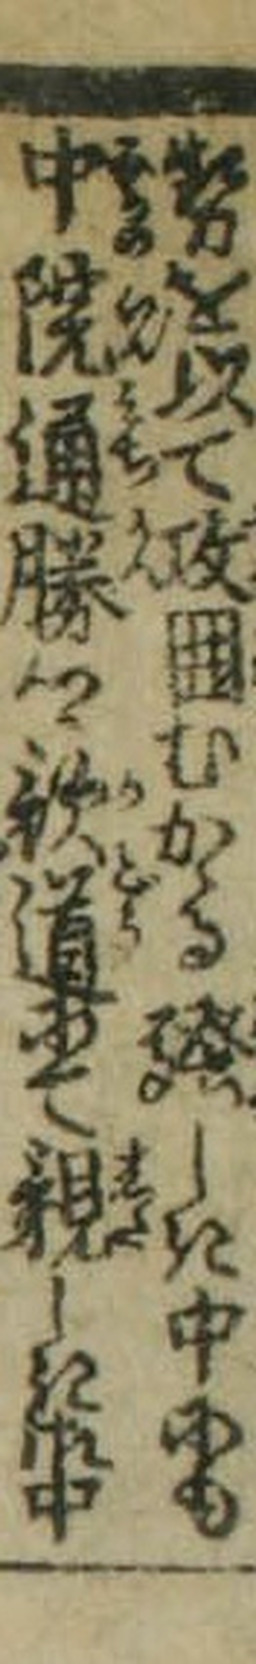中院通勝卿歌道にて親しき御中
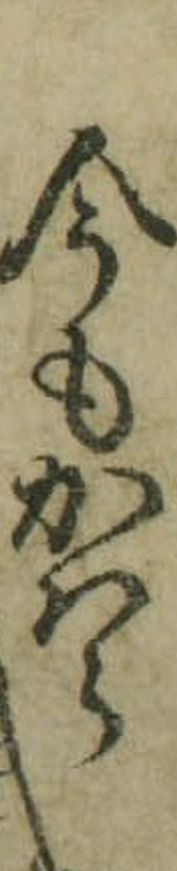今もかはら
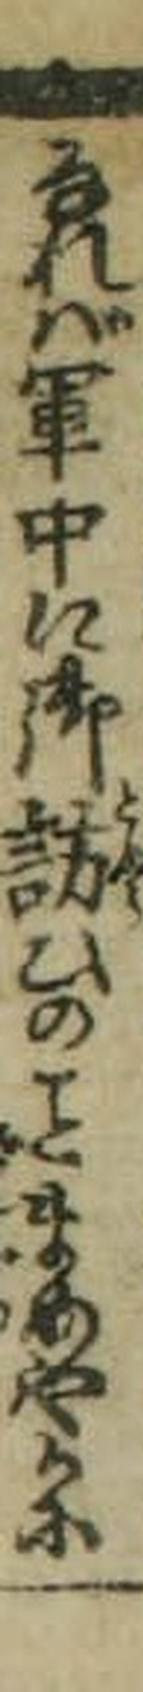なれば軍中に御訪ひのことまめやかに
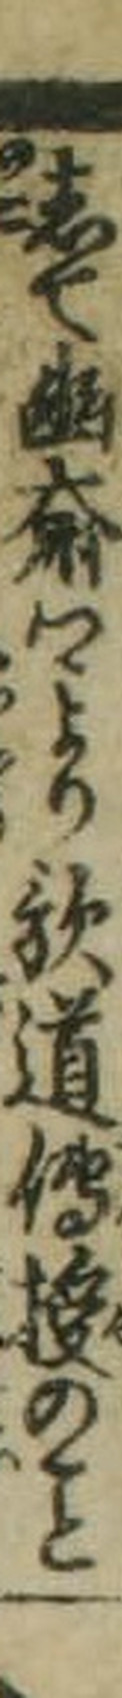して幽斎卿より歌道伝授のこと
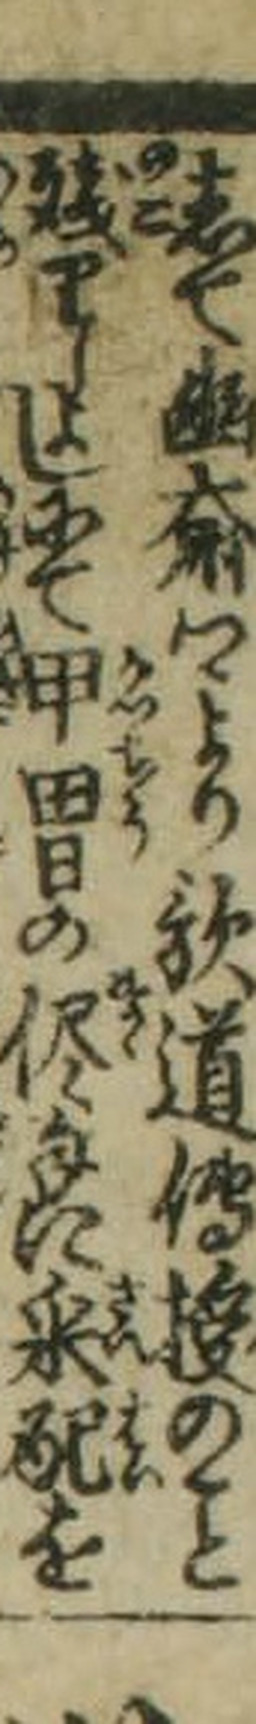残りしよしにて甲冑の侭手に采配を
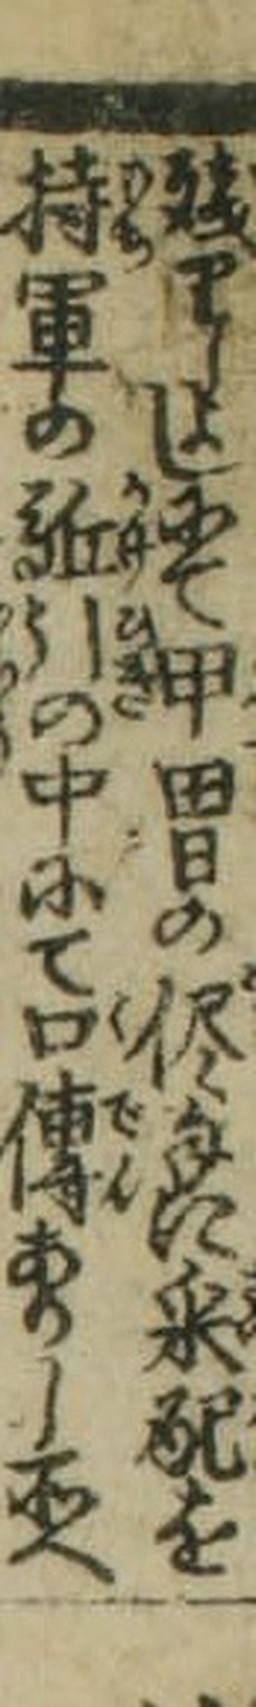持軍の駈引の中にて口伝ありし所へ
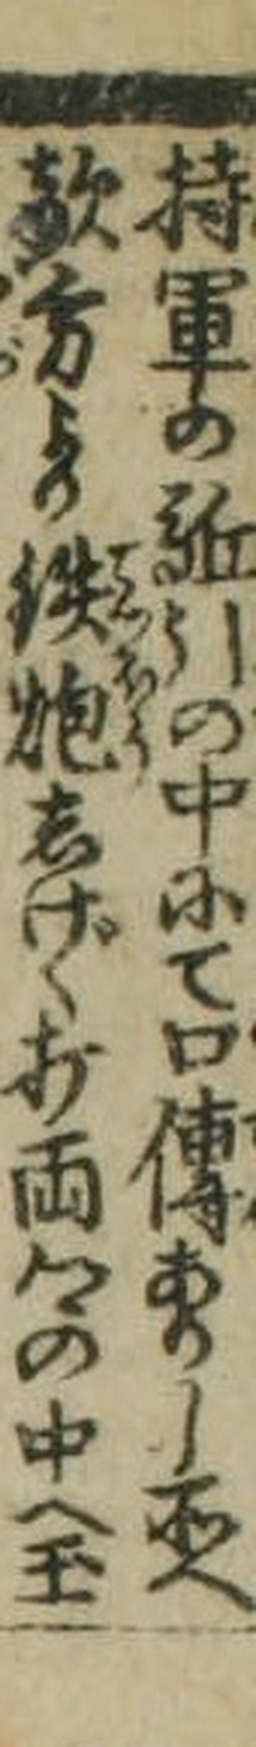歒方より鉄炮しげく打両卿の中へ玉
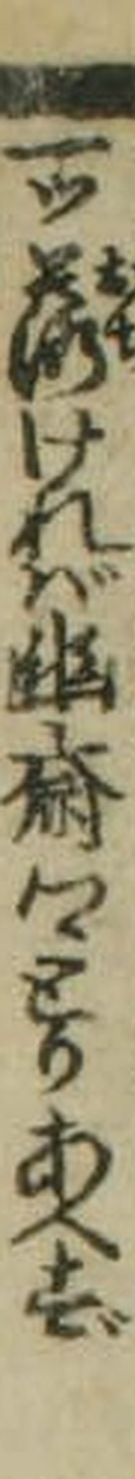一つ落ければ幽斎卿とりあへず
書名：續英雄百人一首
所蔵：東京学芸大学附属図書館
